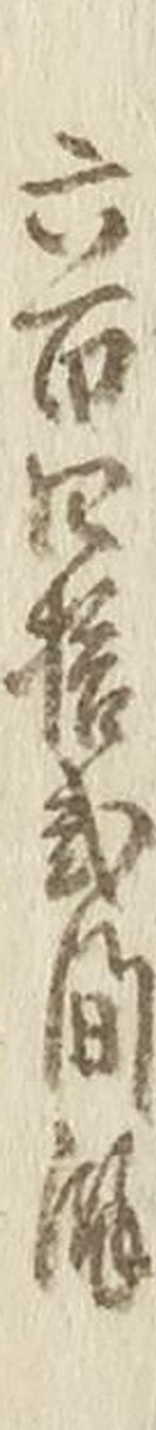六百四拾弐間餘

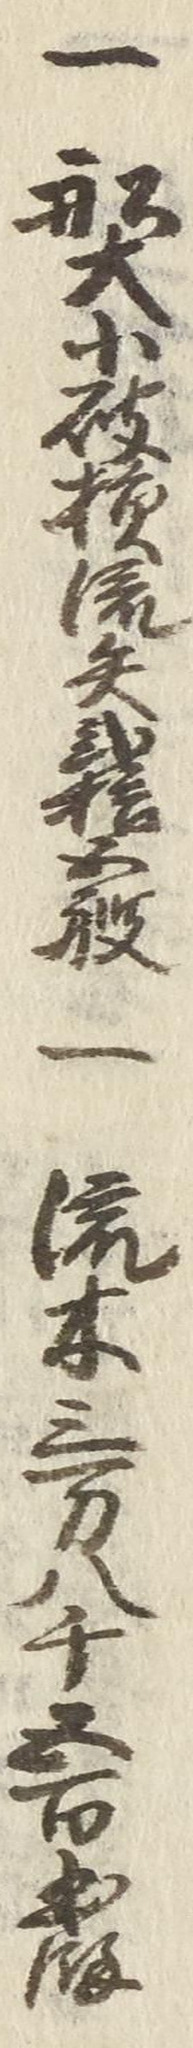一船大小破損流失弐拾五艘一流木三万八千五百本余
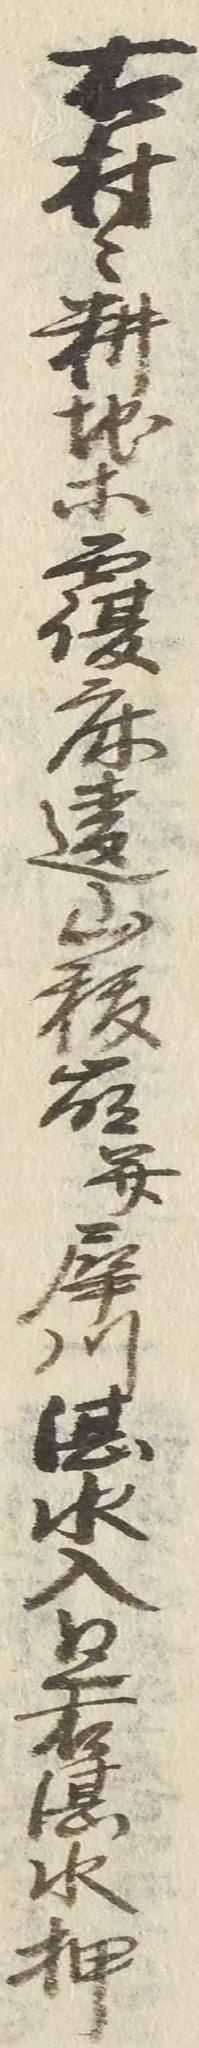右村々耕地等覆床違山稜崩并犀川湛水入且右湛水押
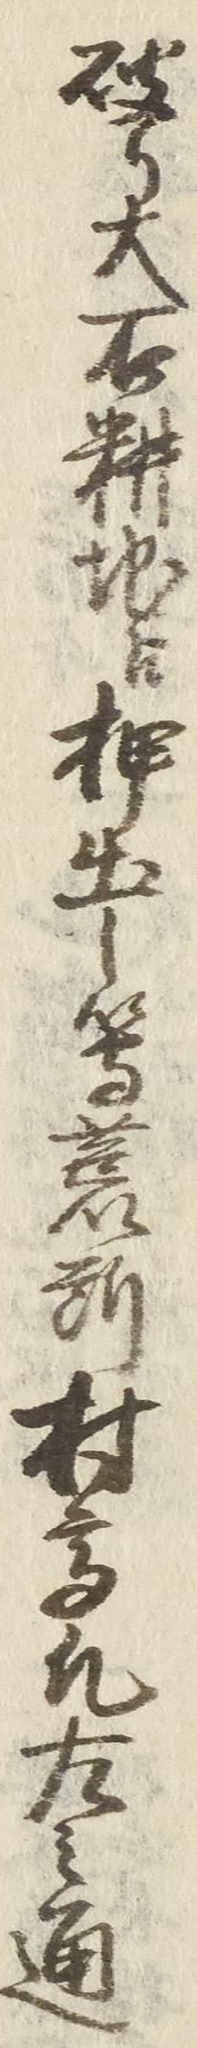破り大石耕地江押出し等荒所村高凡左之通
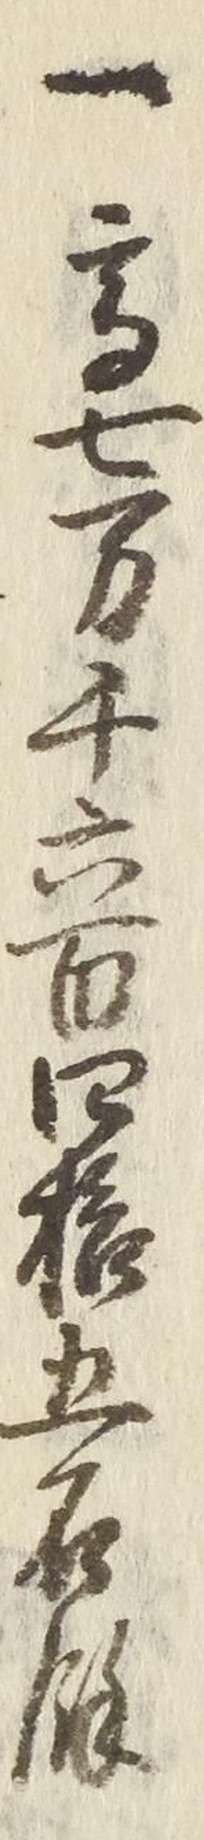一高七万千六百四拾五石余
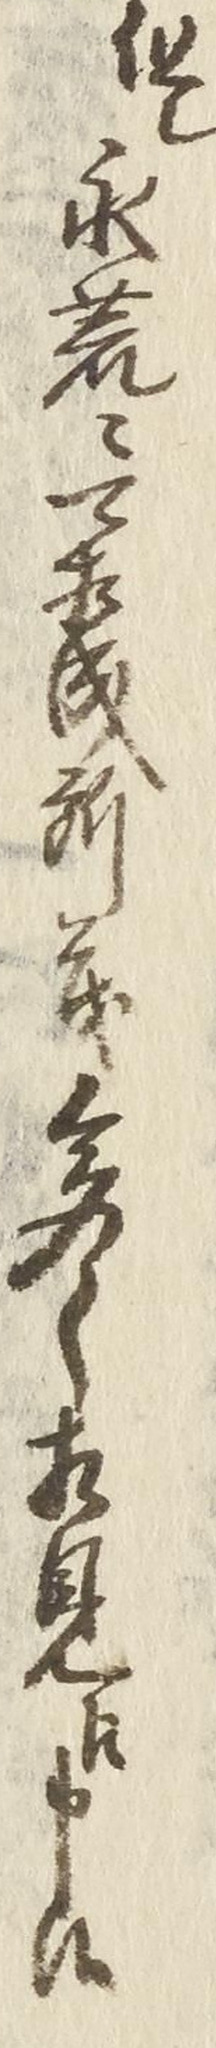但シ永荒ニ可相成所も多く相見江申候
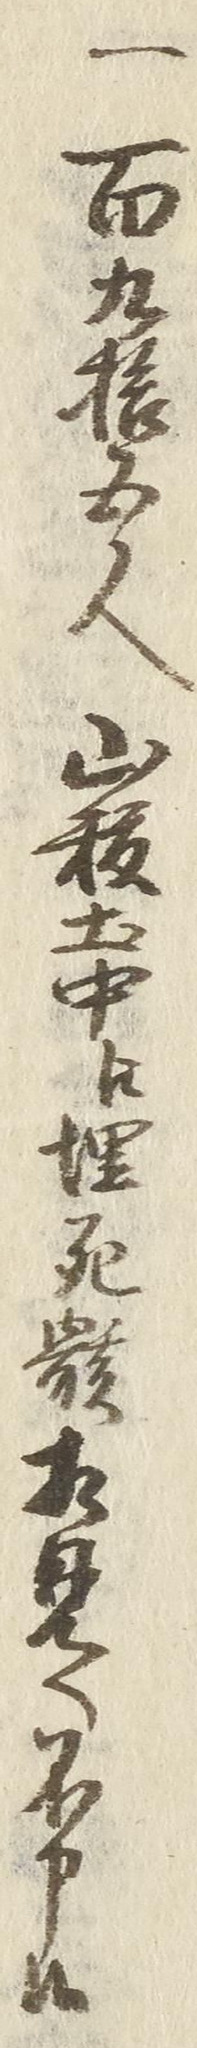一百九拾五人山稜土中江埋死骸相見へ不申候
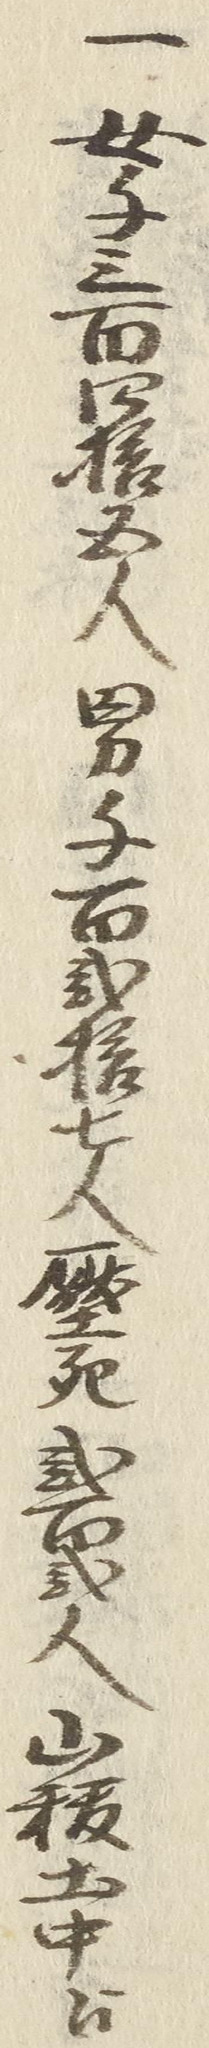一女子三百四拾五人男子百弐拾七人壓死弐百弐人山稜土中江
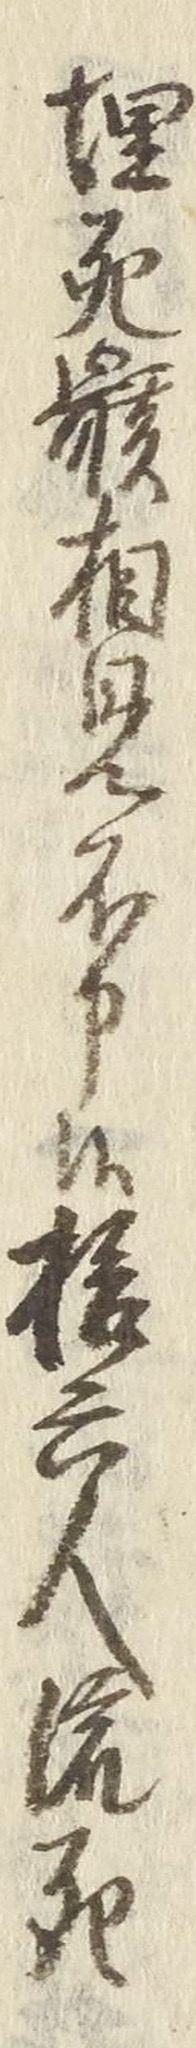埋死骸相見不申候拾六人流死
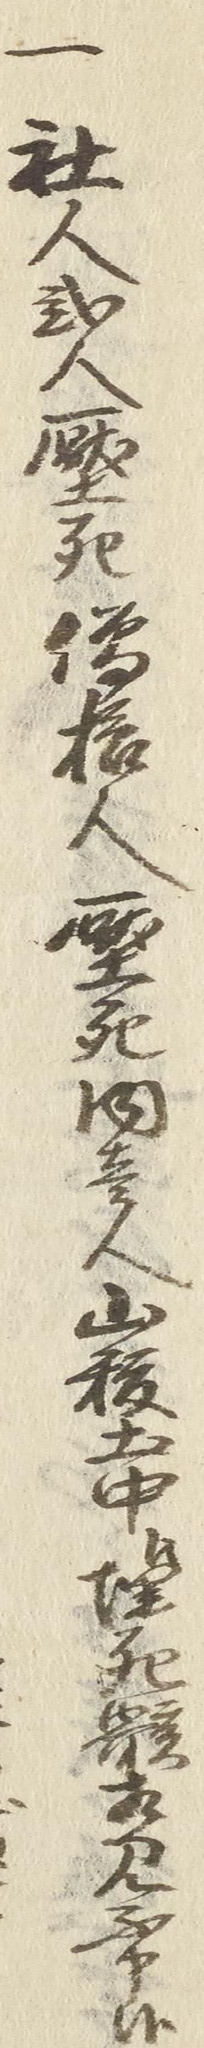一社人弐人壓死僧拾人壓死内壱人山稜土中江埋死骸相見不申候
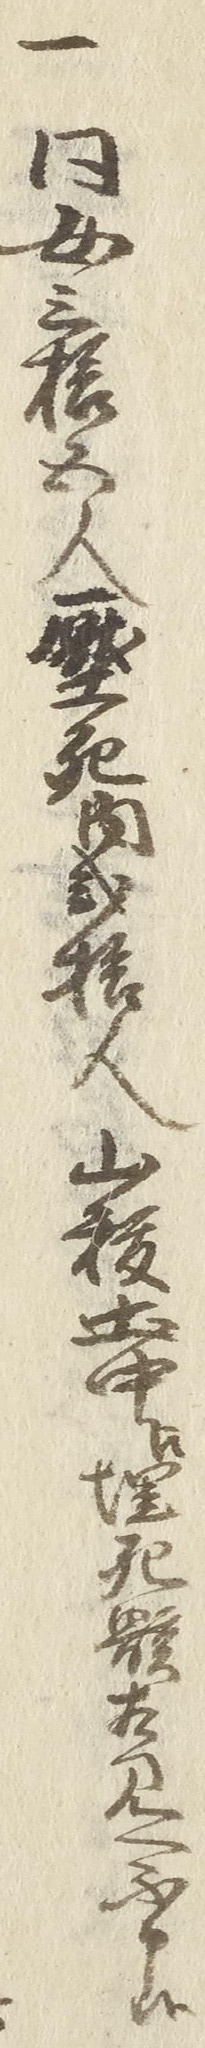一同女三拾五人壓死内弐拾人山稜土中江埋死骸相見へ不申候
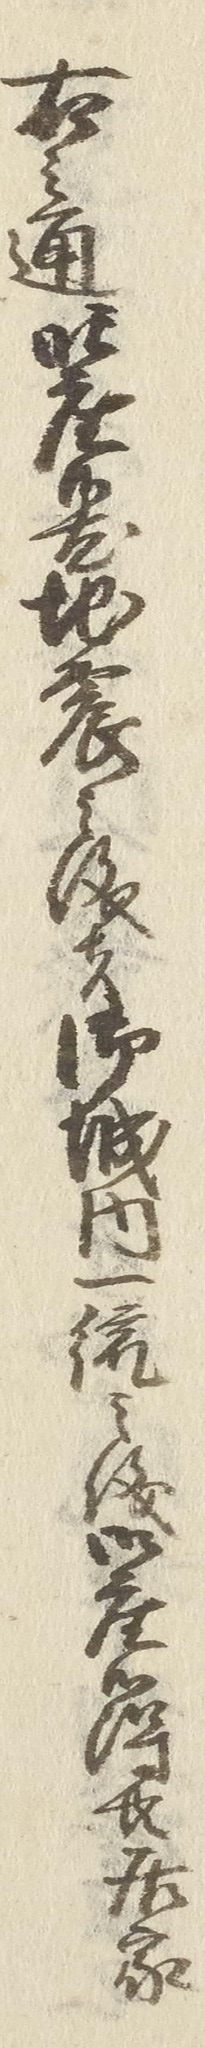右之通ニ御座候尤地震之儀は御城内一統之儀御座候得共居家
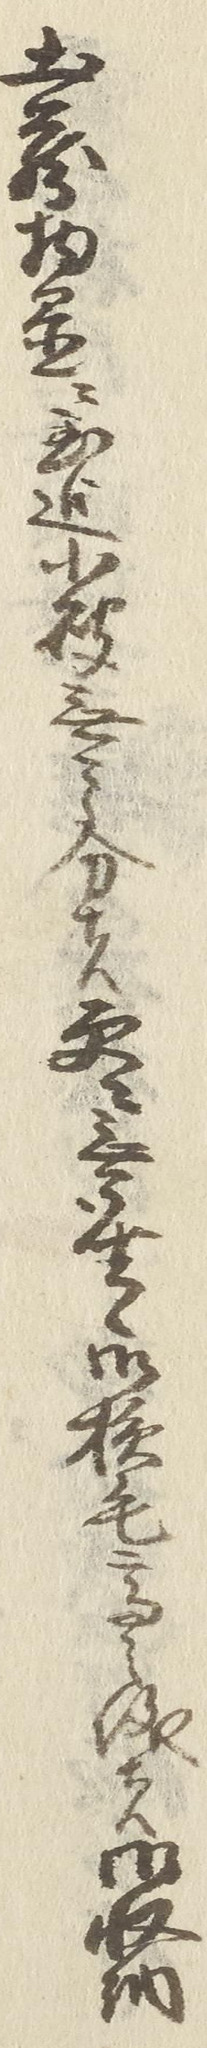土蔵物置ニ至迄小破無之分は更ニ無御座候御損毛方之儀は御収納
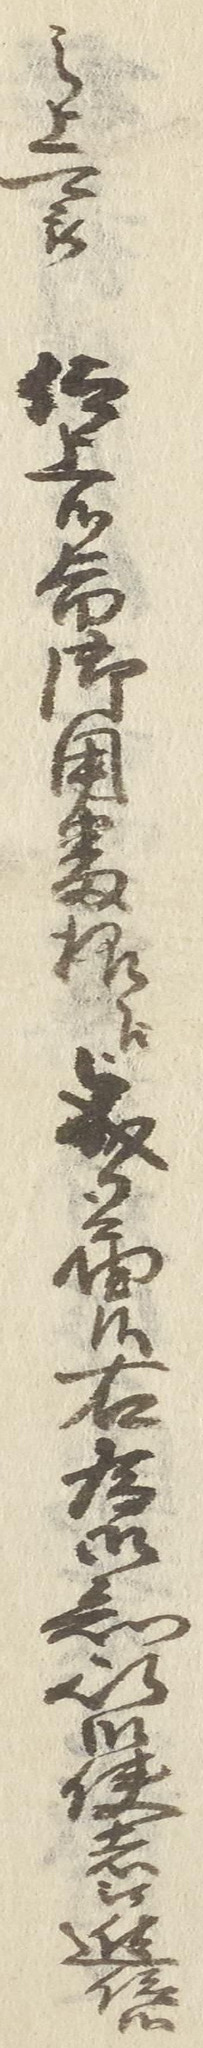之上可被仰上候旨御用番様江被成御届候右為御知以御使者被進候
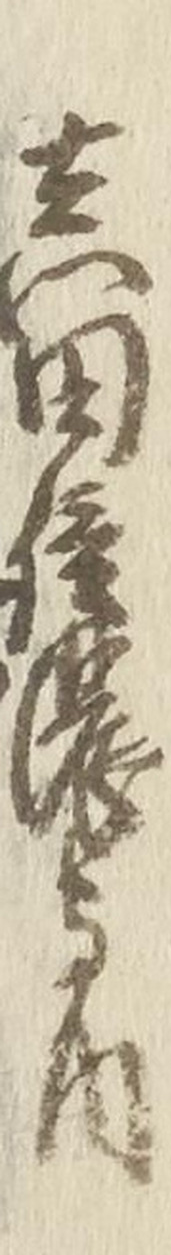真田信濃守内

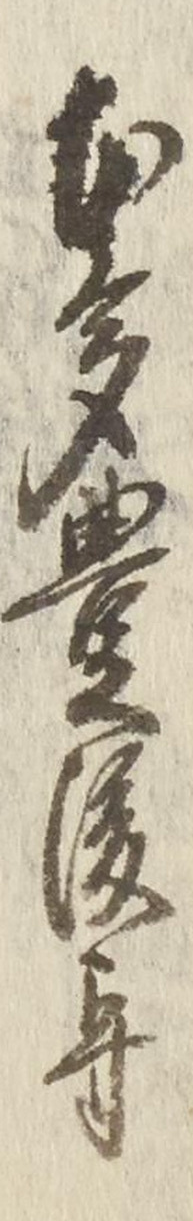本多豊後守
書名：従往古地震御届書記誌之一
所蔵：東京大学地震研究所図書室 Earthquake Research Institute Library, The University of Tokyo, JAPAN
